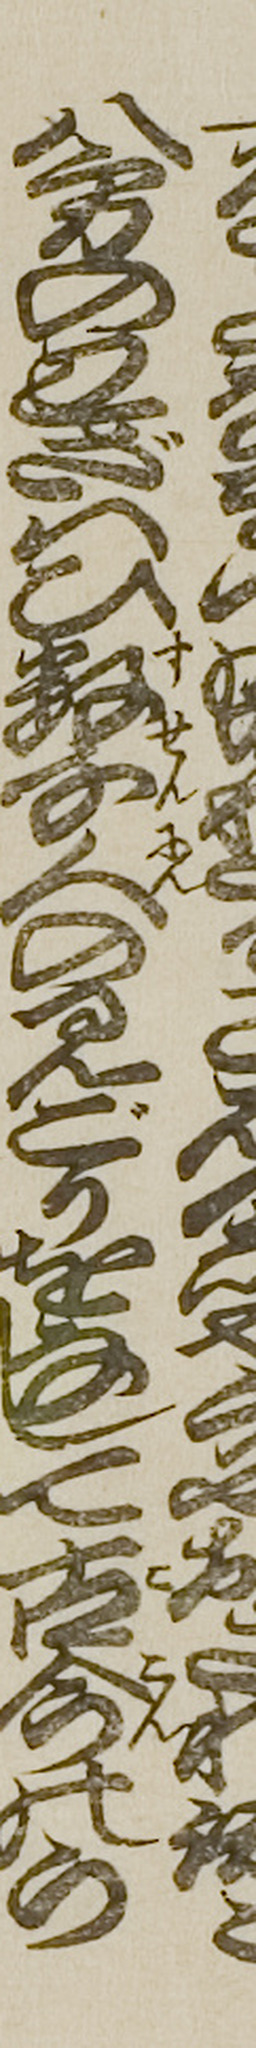八方のわざハひ数千人の見ごりをなして古今のう
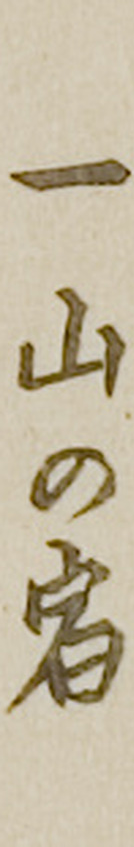一山の宿
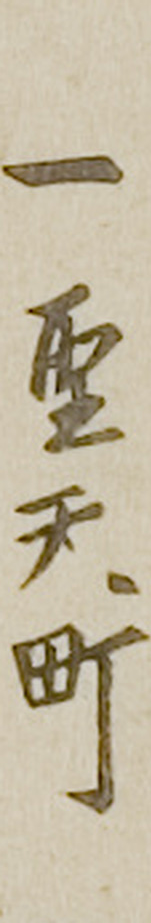一聖天町
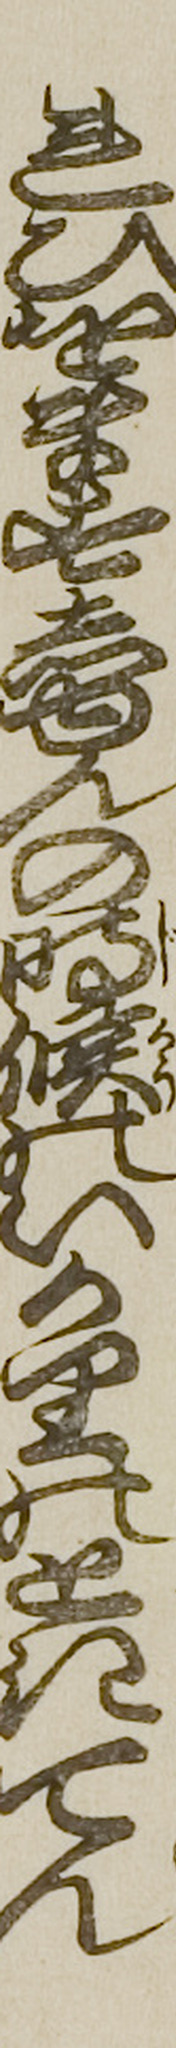れひをますしゆんの時候のいかりのときてん
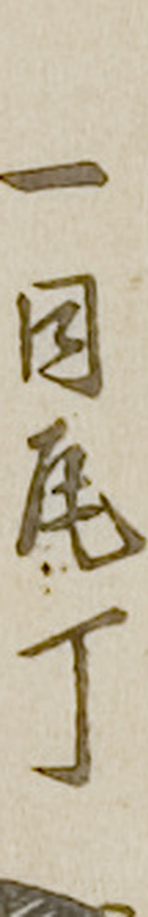一堂瓦丁
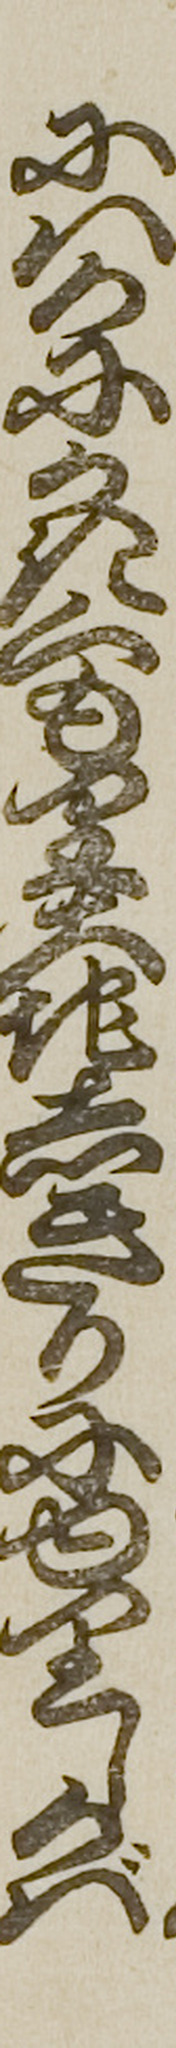にハかにかきくもり大地しきりにゆりしかバ
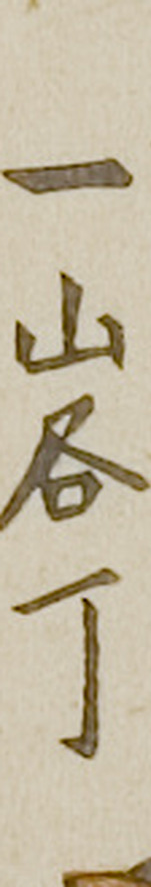一山谷丁
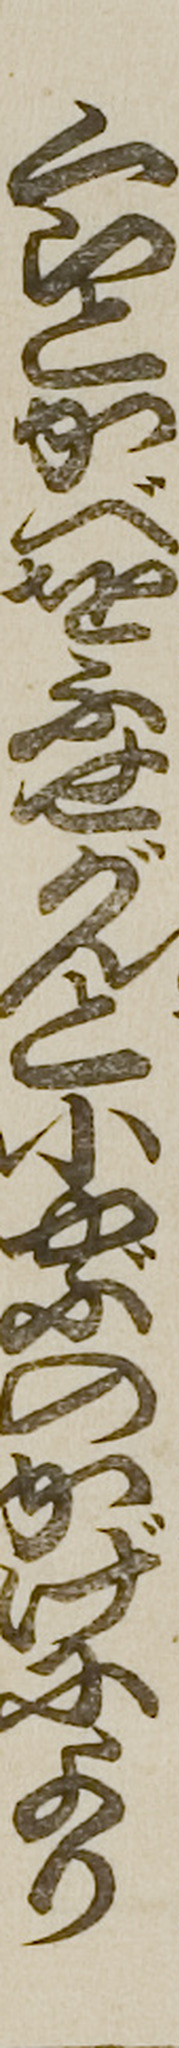くいとかべをふせがんと小やぶのかげにより
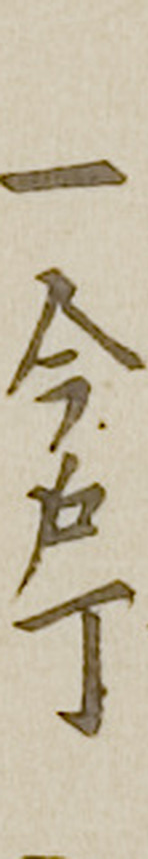一今戸丁
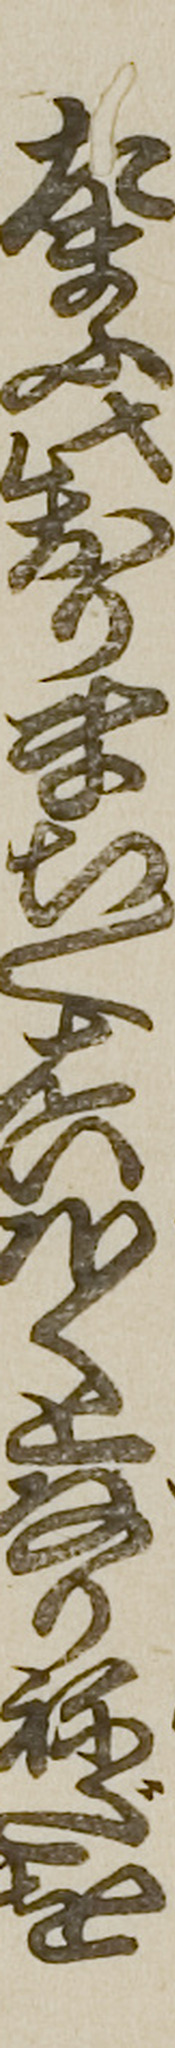たまふ此おりまちくはいほくとなりねだを
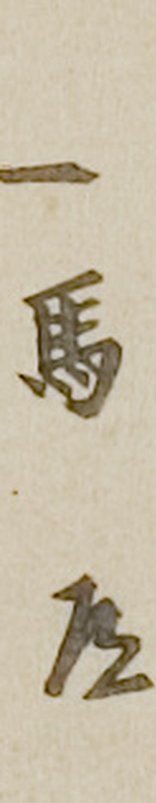一馬道
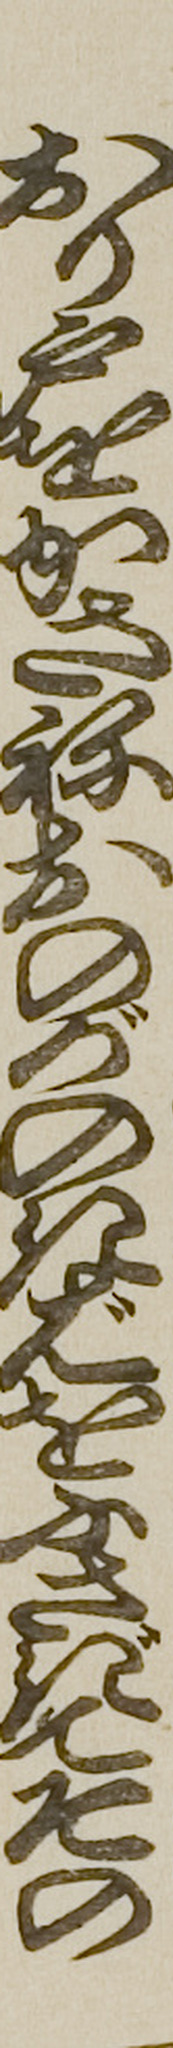おり戸をかたねおのがのきばをふさぎてその
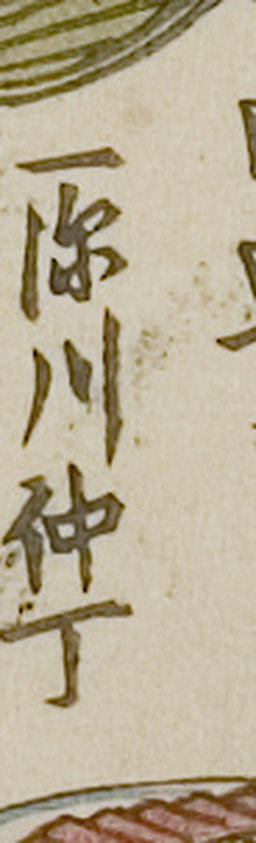一深川仲丁
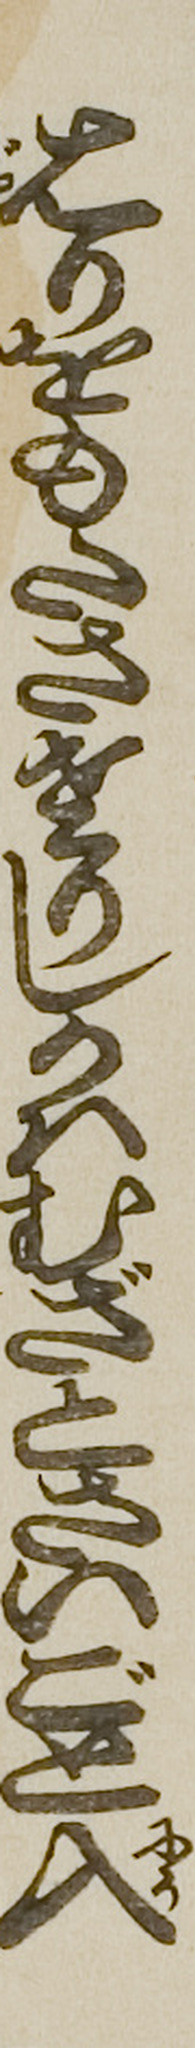はりをもたさをりしかハむざとさいごと入
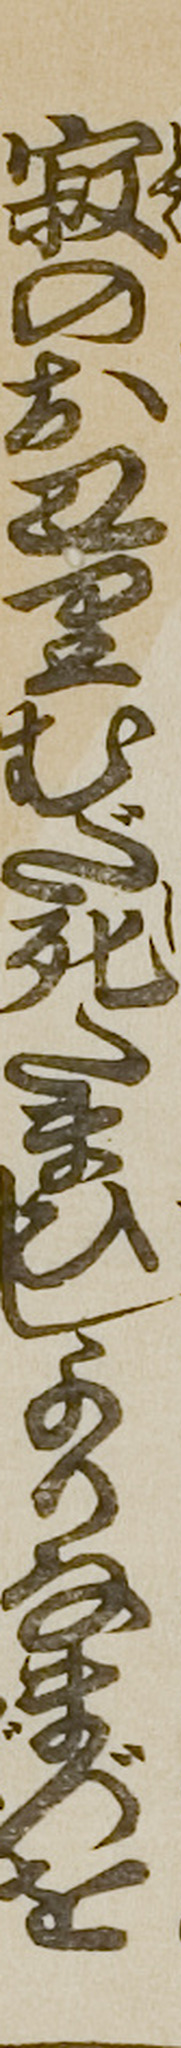寂のおはりむだ死たまひしよりなまづを
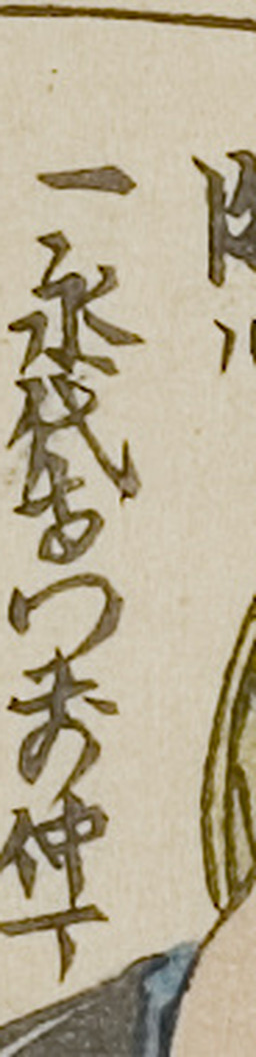一永代寺門前仲丁
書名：老まづ
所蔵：東京大学総合図書館 General Library in the University of Tokyo, JAPAN
